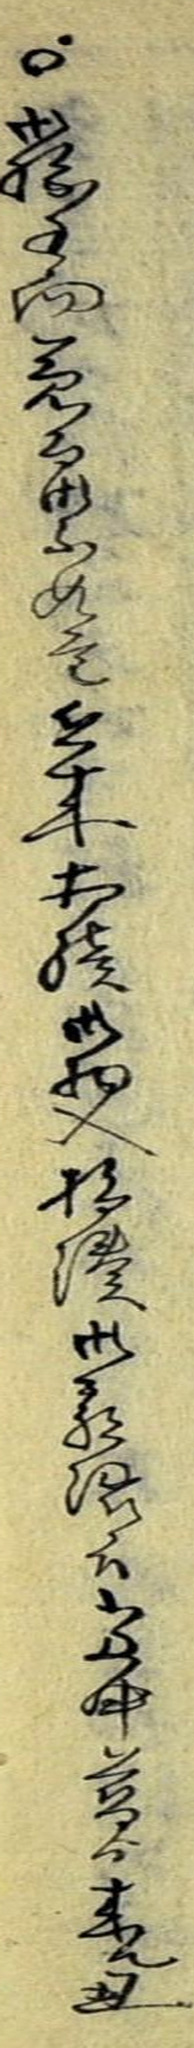○御勝手向兼而御不如意近来相続御物入指湊御難渋に付当年暮ゟ来ル丑

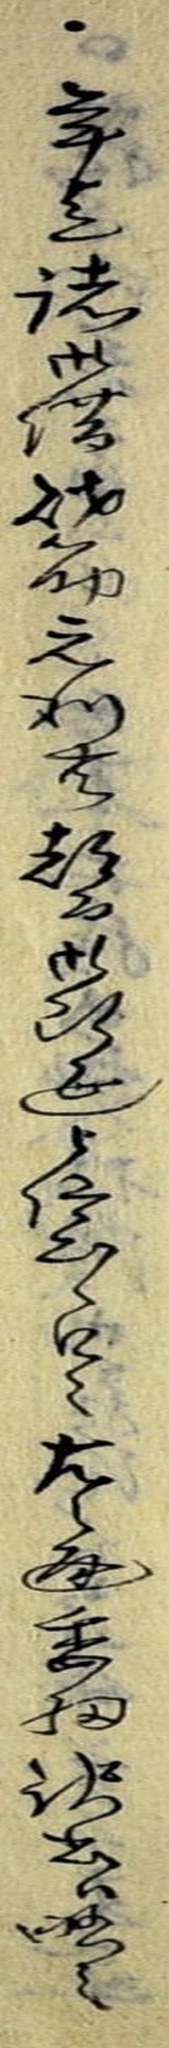年迄諸御借財筋元利共都而御断延被仰出候口々左之通委細訳書は略之
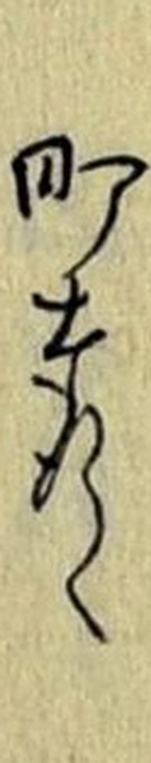御奉行へ
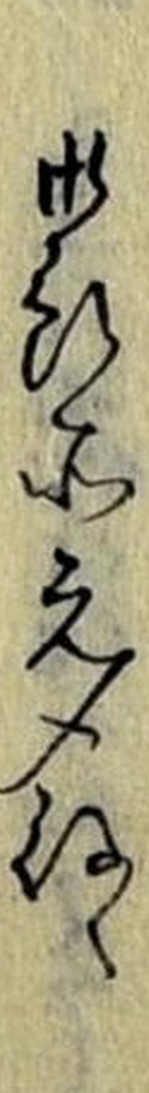御預所元〆役へ
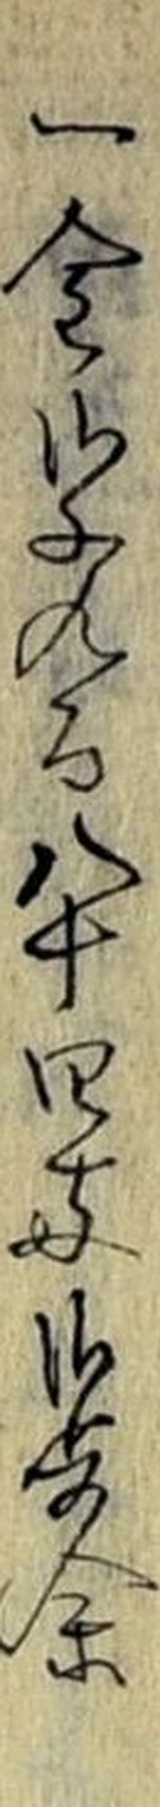一金弐千九百八十四両弐歩余同断
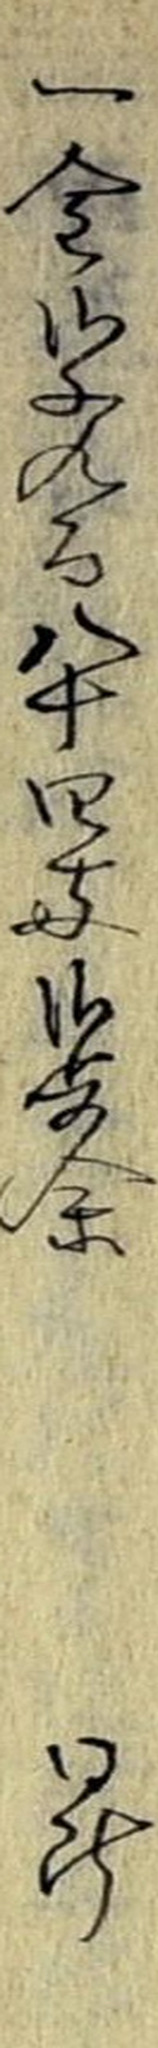一金弐千九百八十四両弐歩余同断
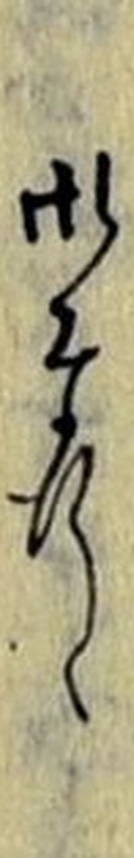御奉行へ
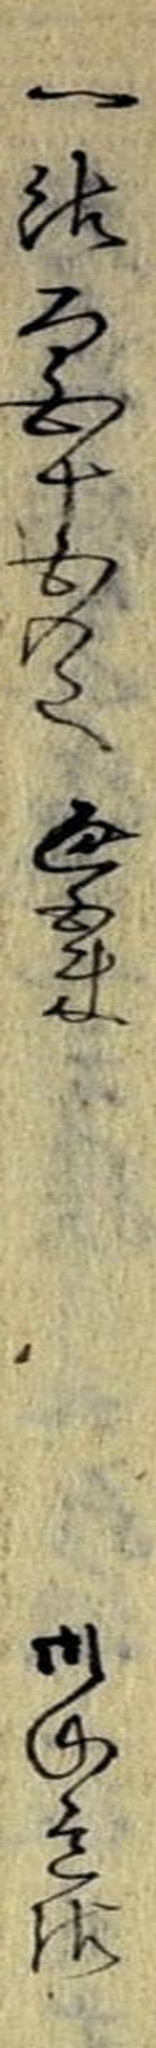一銀百十五貫匁通五朱御趣意銀
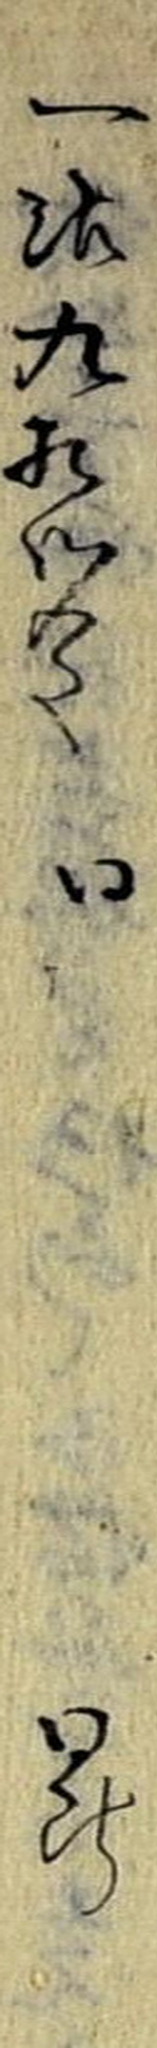一銀九拾弐貫匁同同断
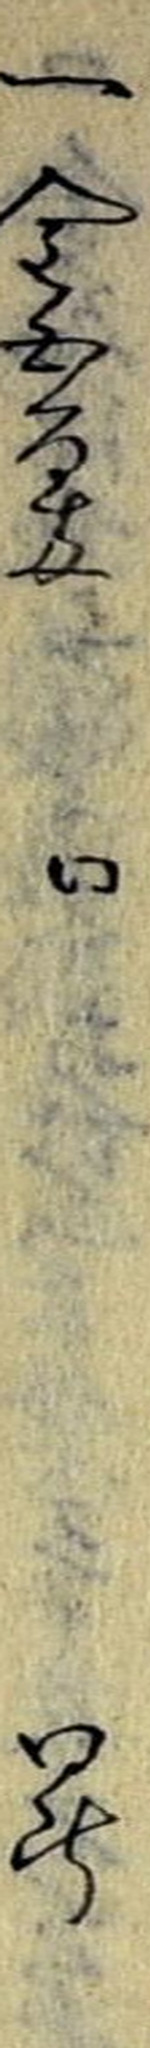一金五百両同同断
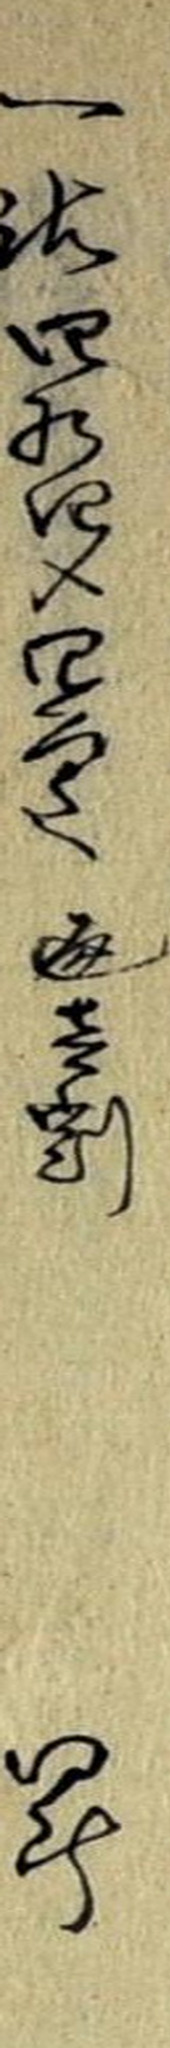一銀四拾四貫四百匁通壱割同断
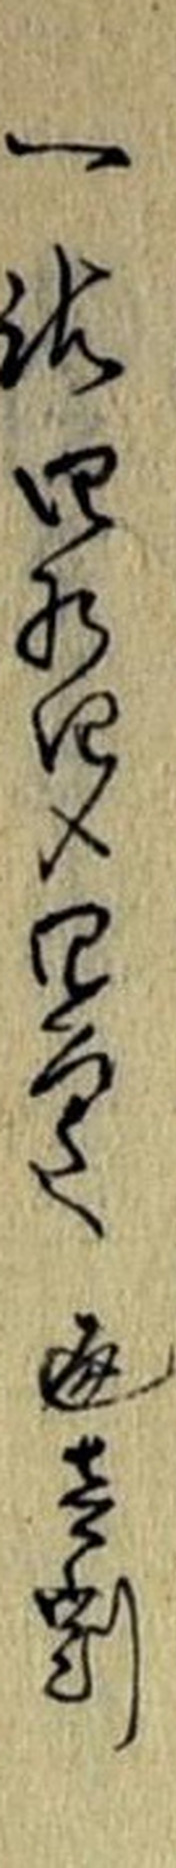一銀四拾四貫四百匁通壱割同断
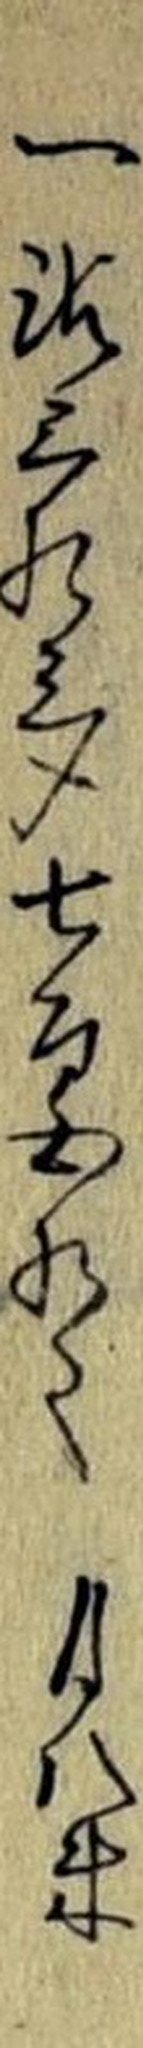一銀三拾三貫七百五拾匁月八朱同断
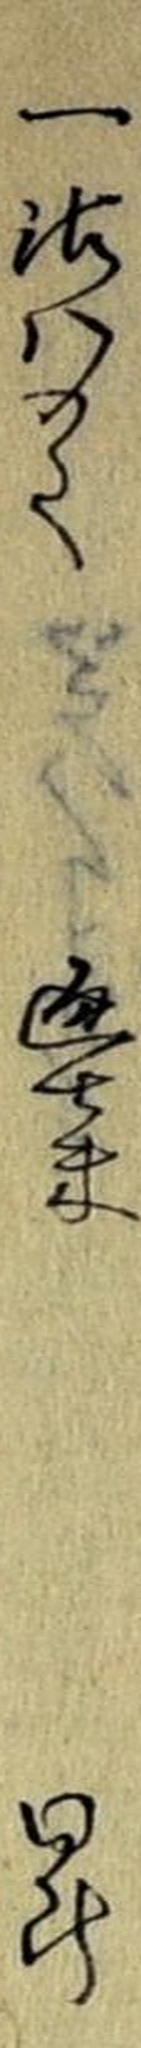一銀八貫匁通七朱同断
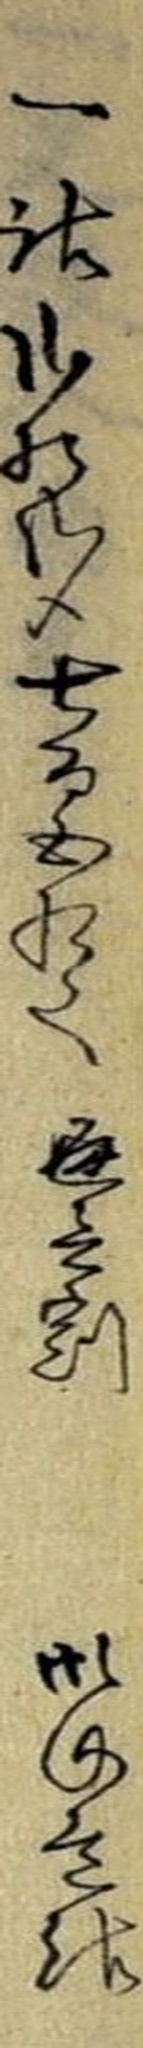一銀弐拾弐貫七百五拾匁通壱割御趣意銀
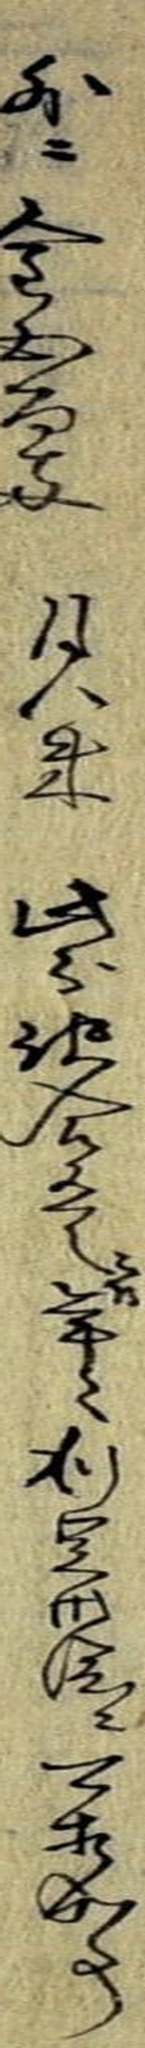外に金五百両月八朱此分訳合有之に付年々利息御渡に可相成事
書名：命令之部 四
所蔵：福井県文書館 Fukui Prefectural Archives
